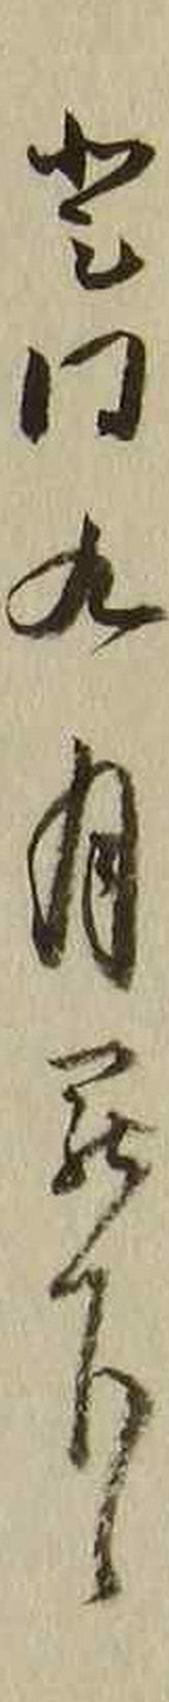登同九月罷下候
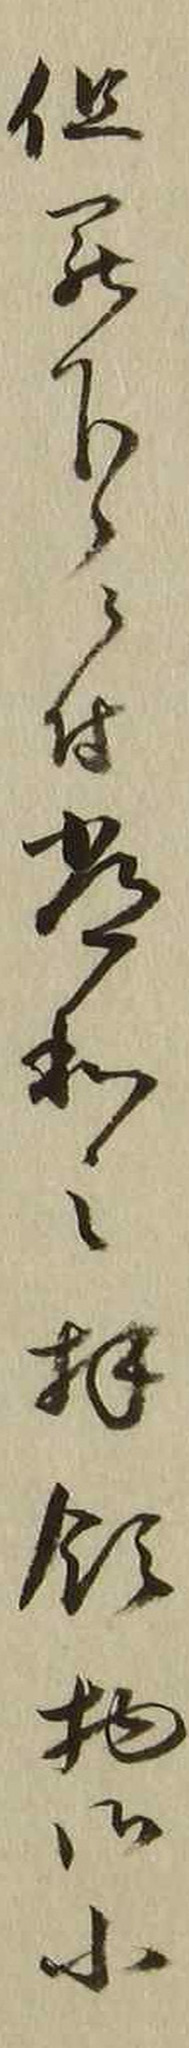但罷下候ニ付常和之拝領物御小
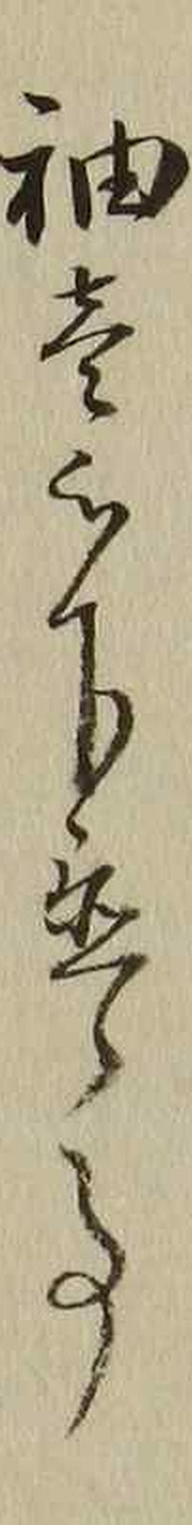袖壱被下置候事
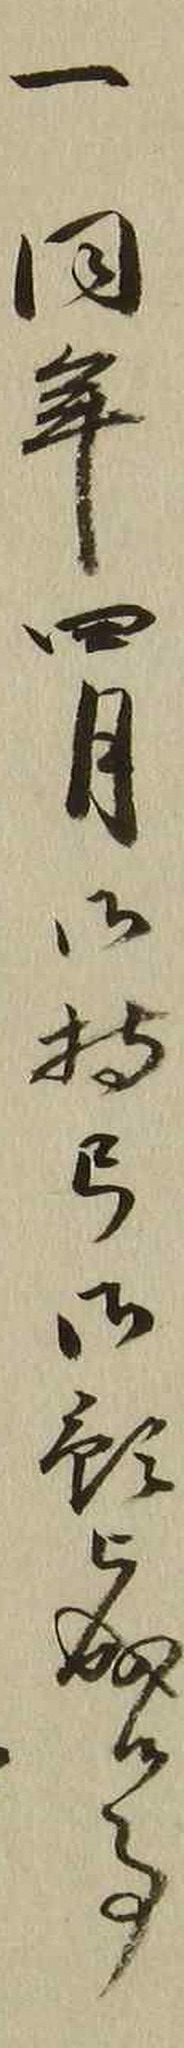一同年四月御持弓御預被成候事
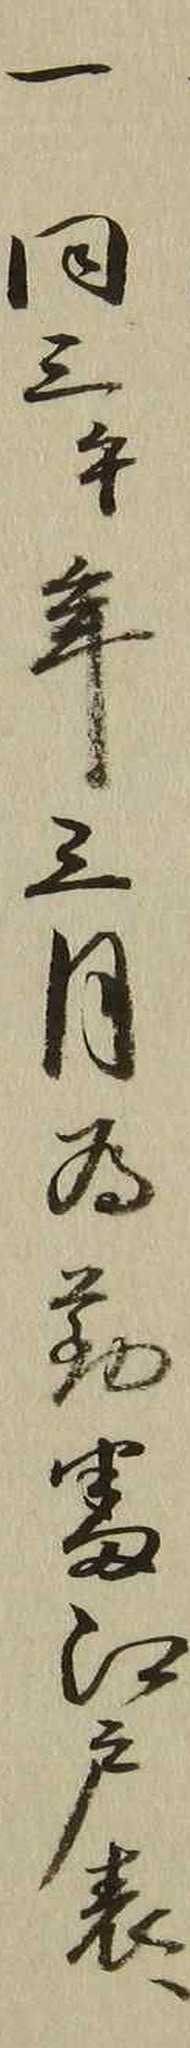一同三午年三月為勤番江戸表へ
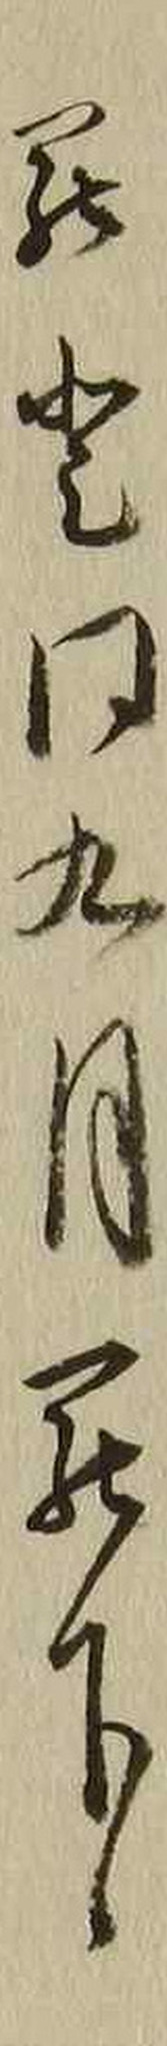罷登同九月罷下候
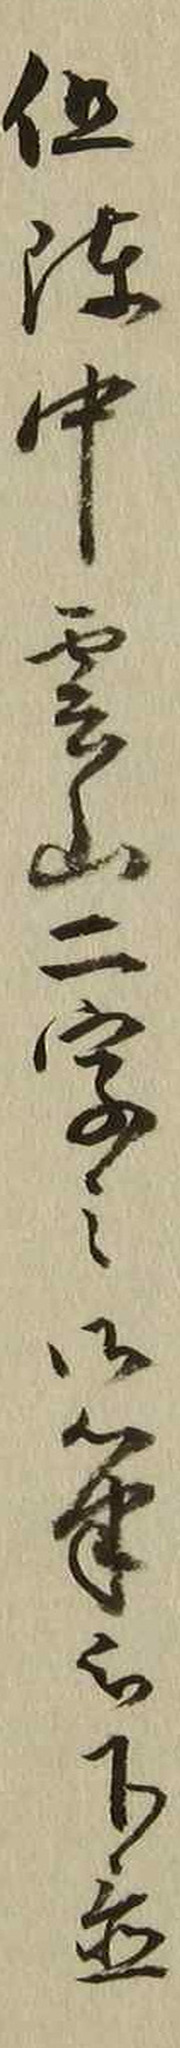但陣中雲山二字之御筆被下置
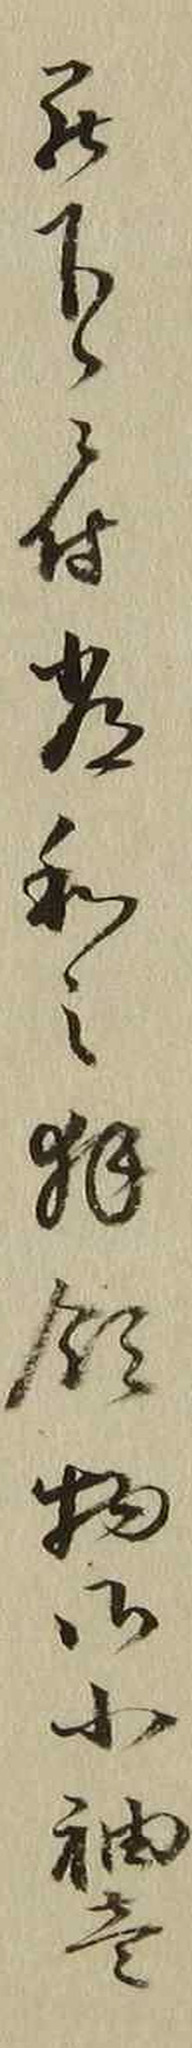罷下候ニ付常和之拝領物御小袖壱
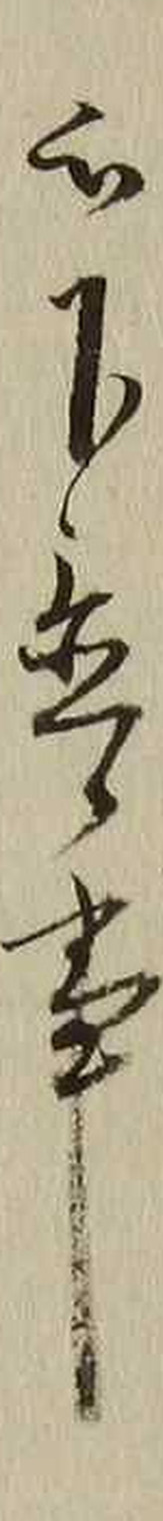被下置候事
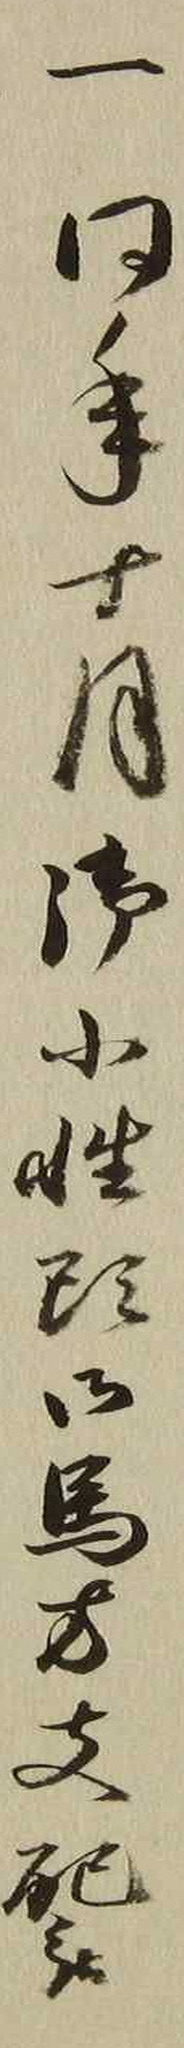一同年十月御小性頭御馬方支配被
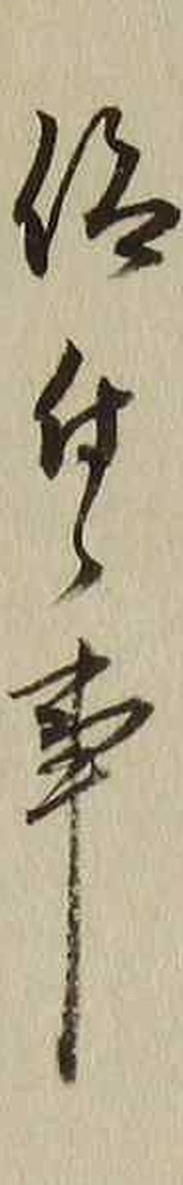仰付候事
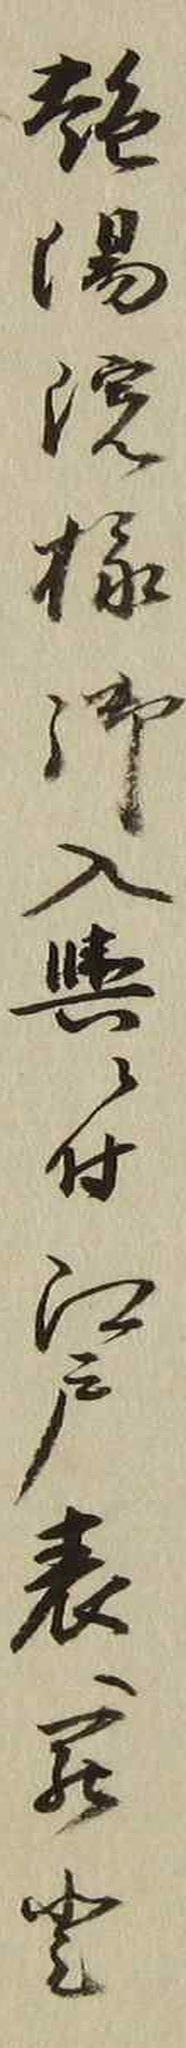艶陽院様御入輿ニ付江戸表へ罷登
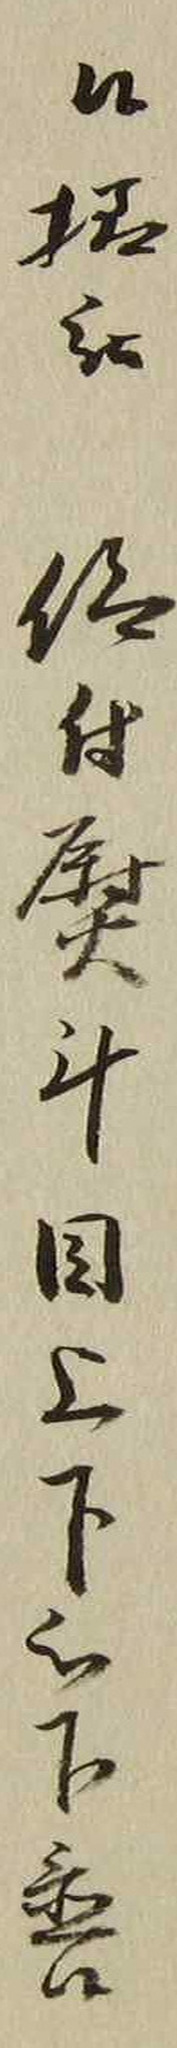候様被仰付熨斗目上下被下置候
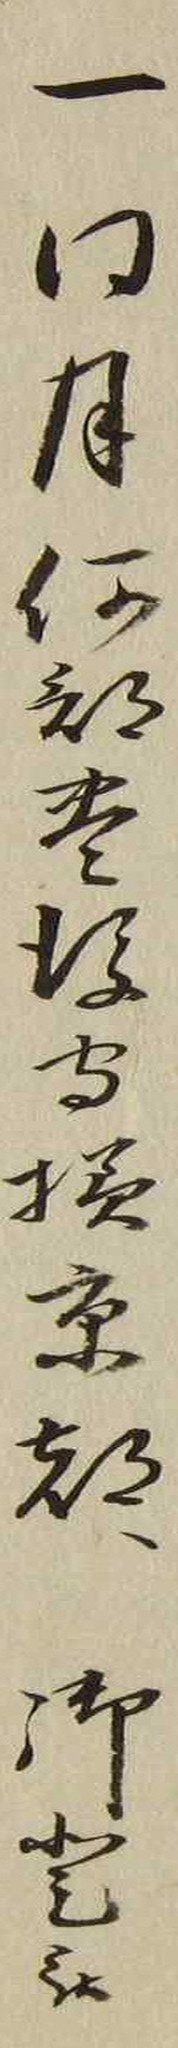一同月阿部豊後守様京都へ御登被
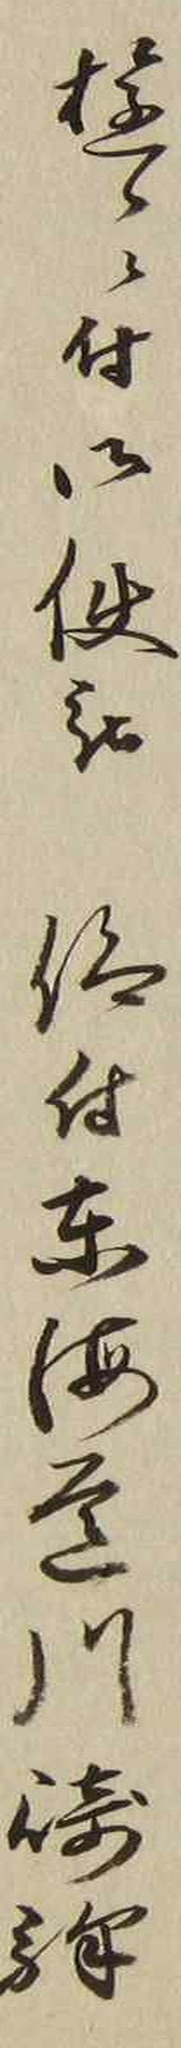遊候ニ付御使被仰付東海道川崎駅
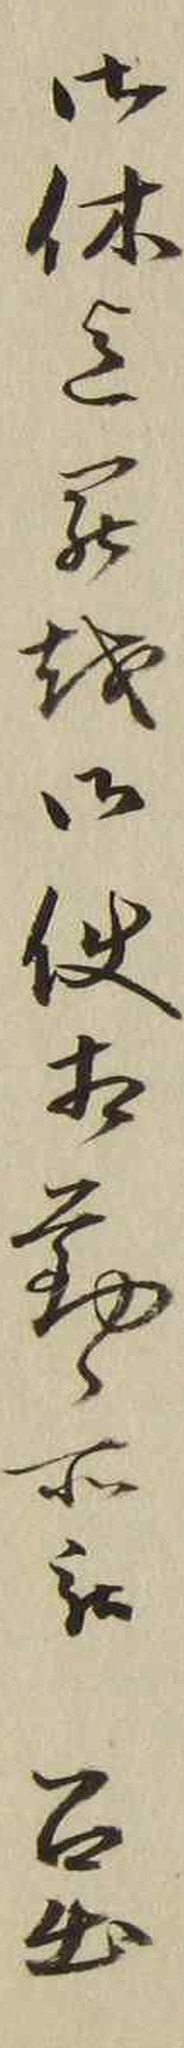御休迄罷越御使相勤候所被召出
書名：諸士系譜　巻之69　を之部3
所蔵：会津若松市立会津図書館
